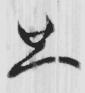也
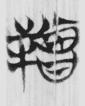矰
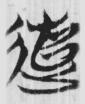追
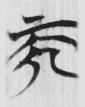而
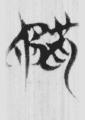{矛咠}
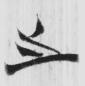之
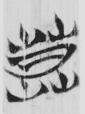莫
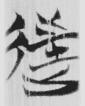{辶之𡈼}
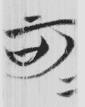可=
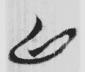㠯（以）
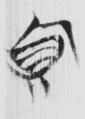{宀貝}
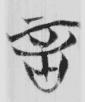言
